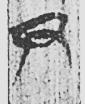尹
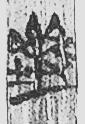襄
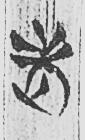老
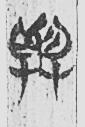與
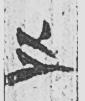之
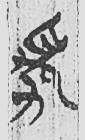爭
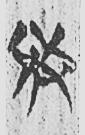敓
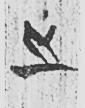之
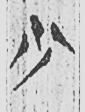少
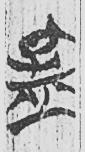{孔皿}
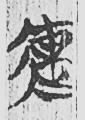連
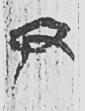尹
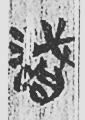{止頁戈}
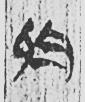於
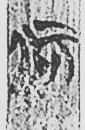河
